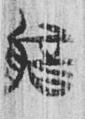𨟻（將）
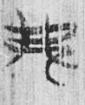弗
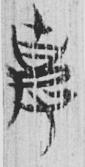尅
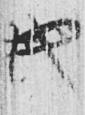母
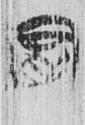冒
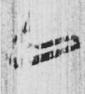㠯（以）
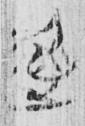○（陷）
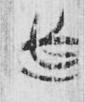必
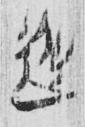○（過）
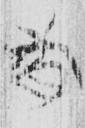前
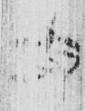攻
